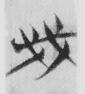{戈戈}
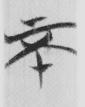不
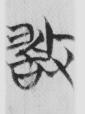敢
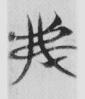弗
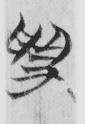受
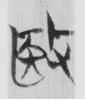殹
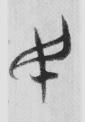民
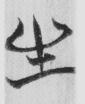生
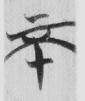不
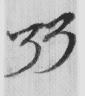{乃乃}
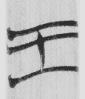王
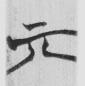亓
